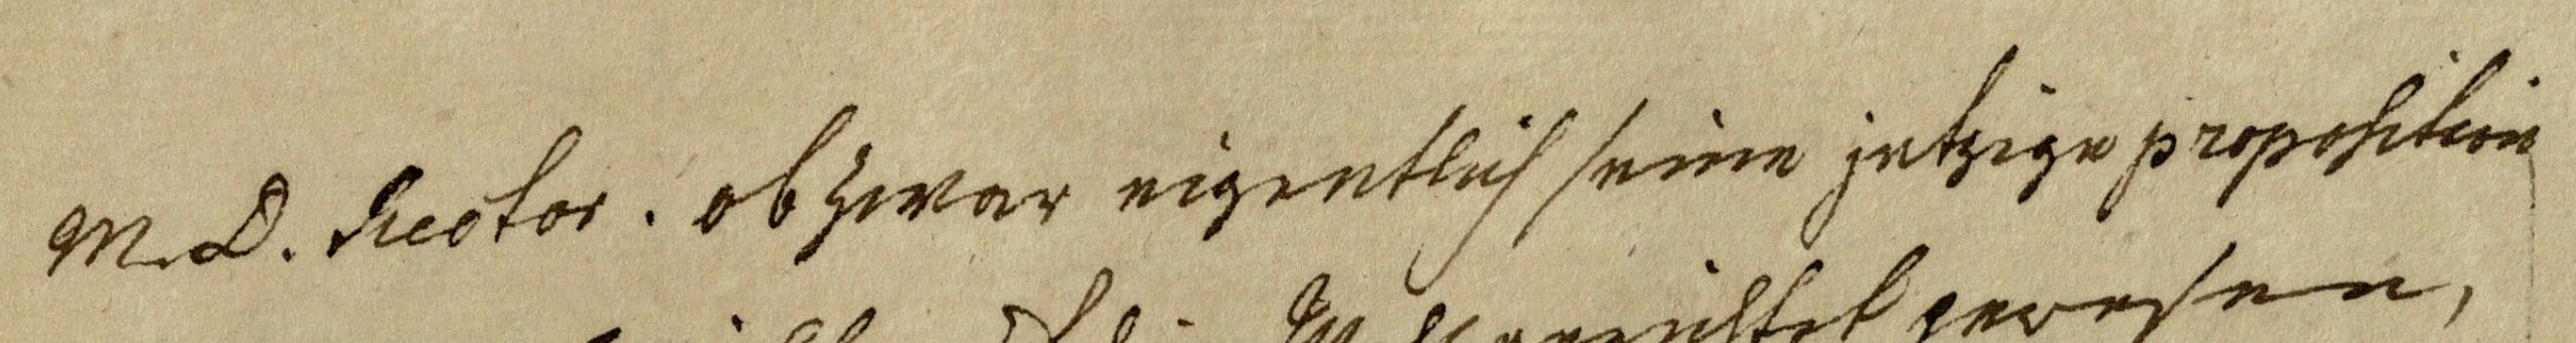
M. D. Rector. ob zwar eigentlich seine jetzige proposition
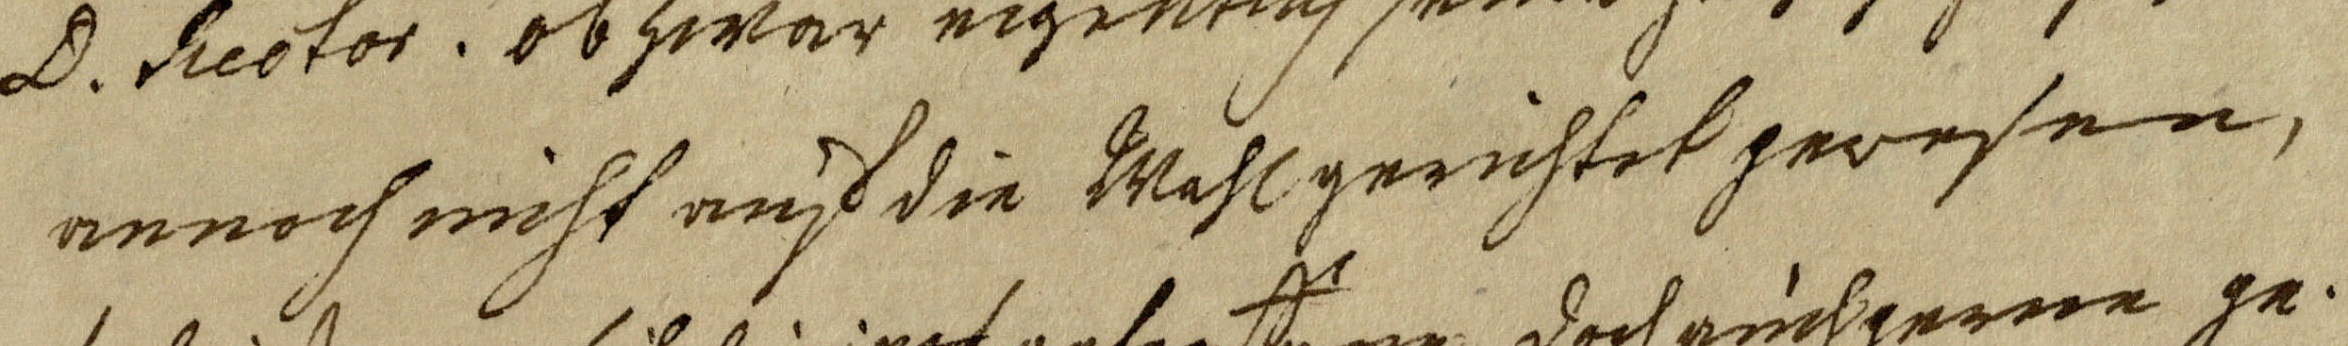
annoch nicht auf die Wahl gerichtet gewesen,
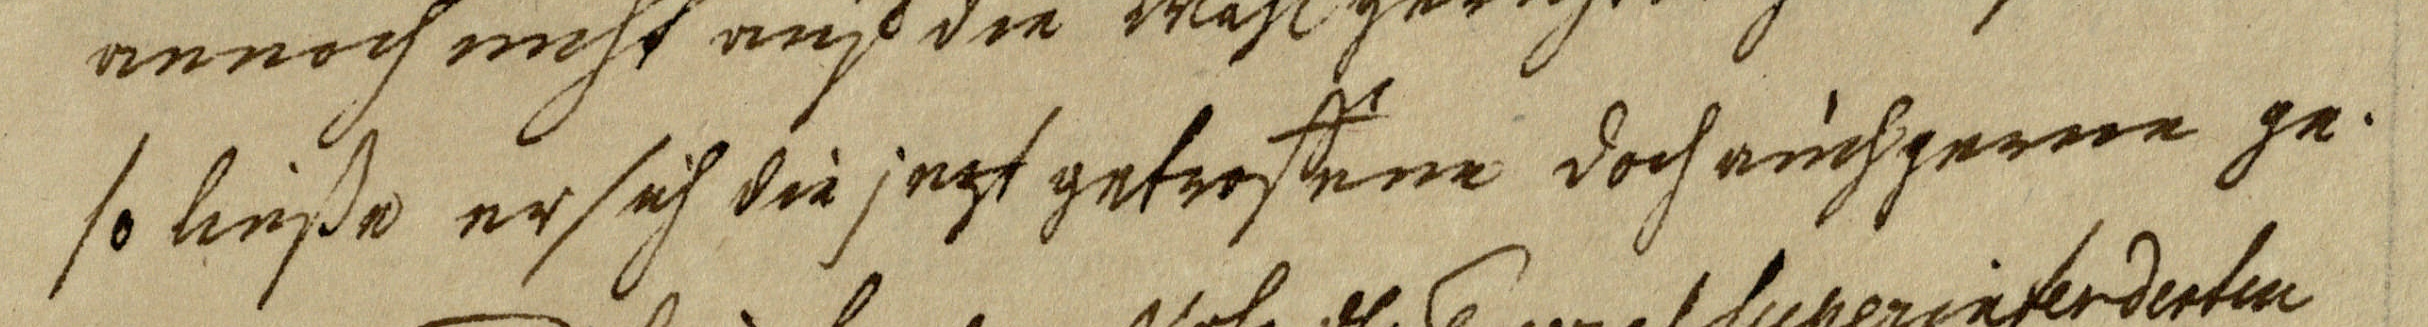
so ließe er sich die jezt getroffene doch auch gerne ge¬
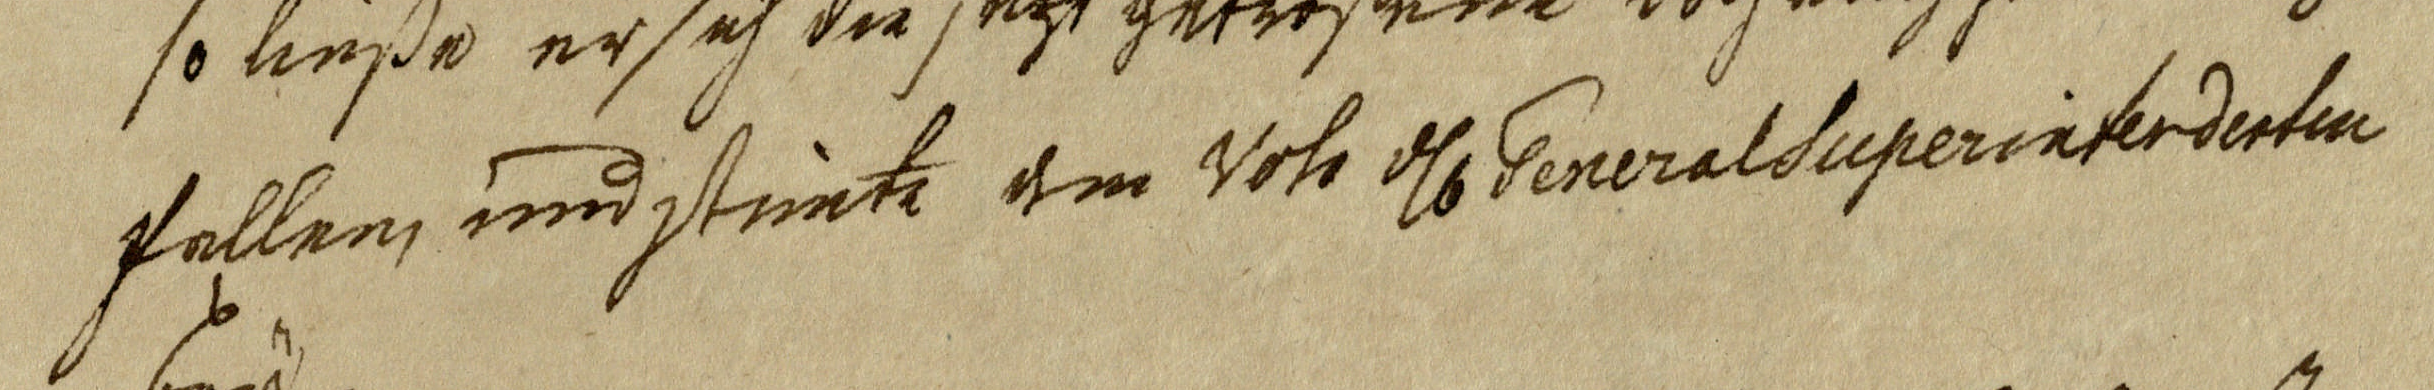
fallen, und stimte dem voto dh GeneralSuperintendenten
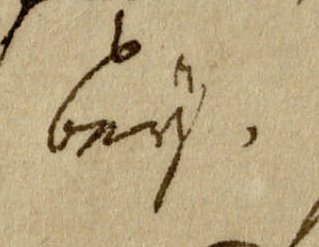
beÿ.
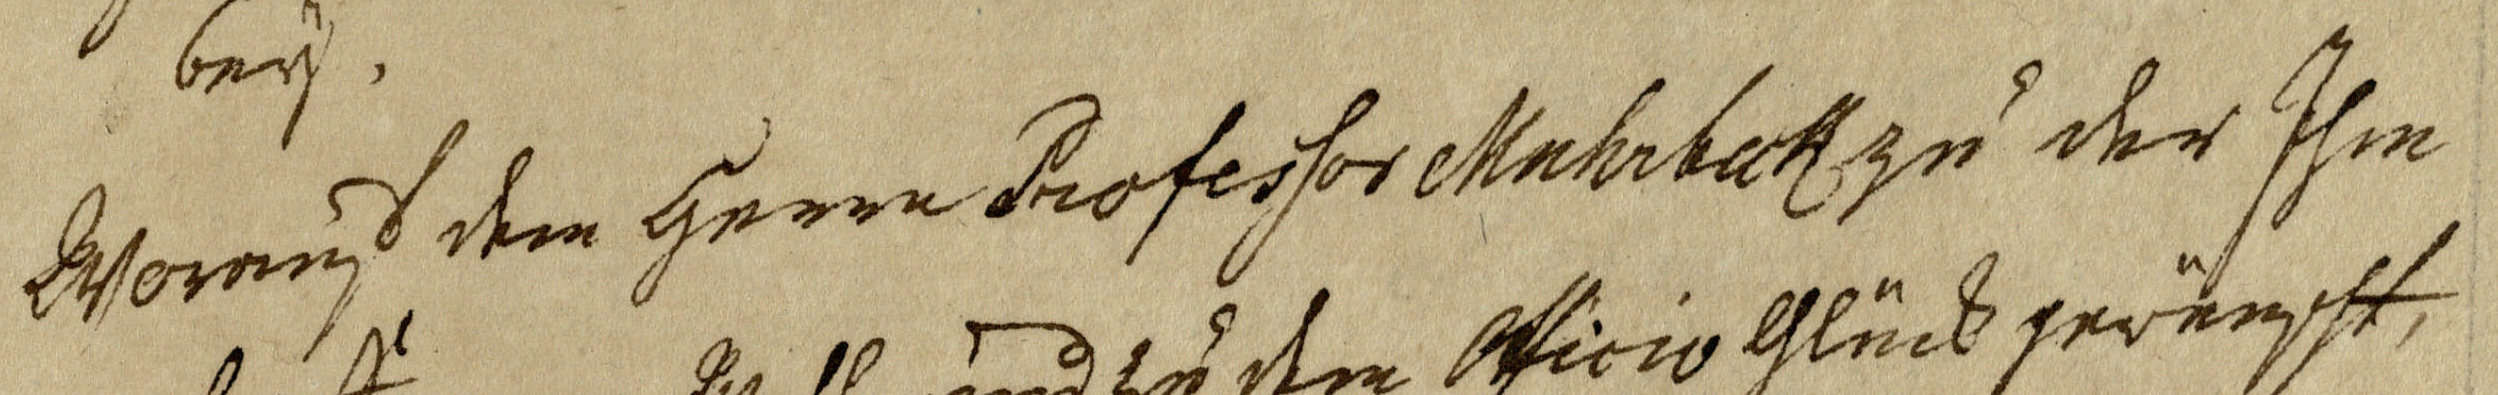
Worauf dem Herrn Professor Muhrbeck zu der Ihm
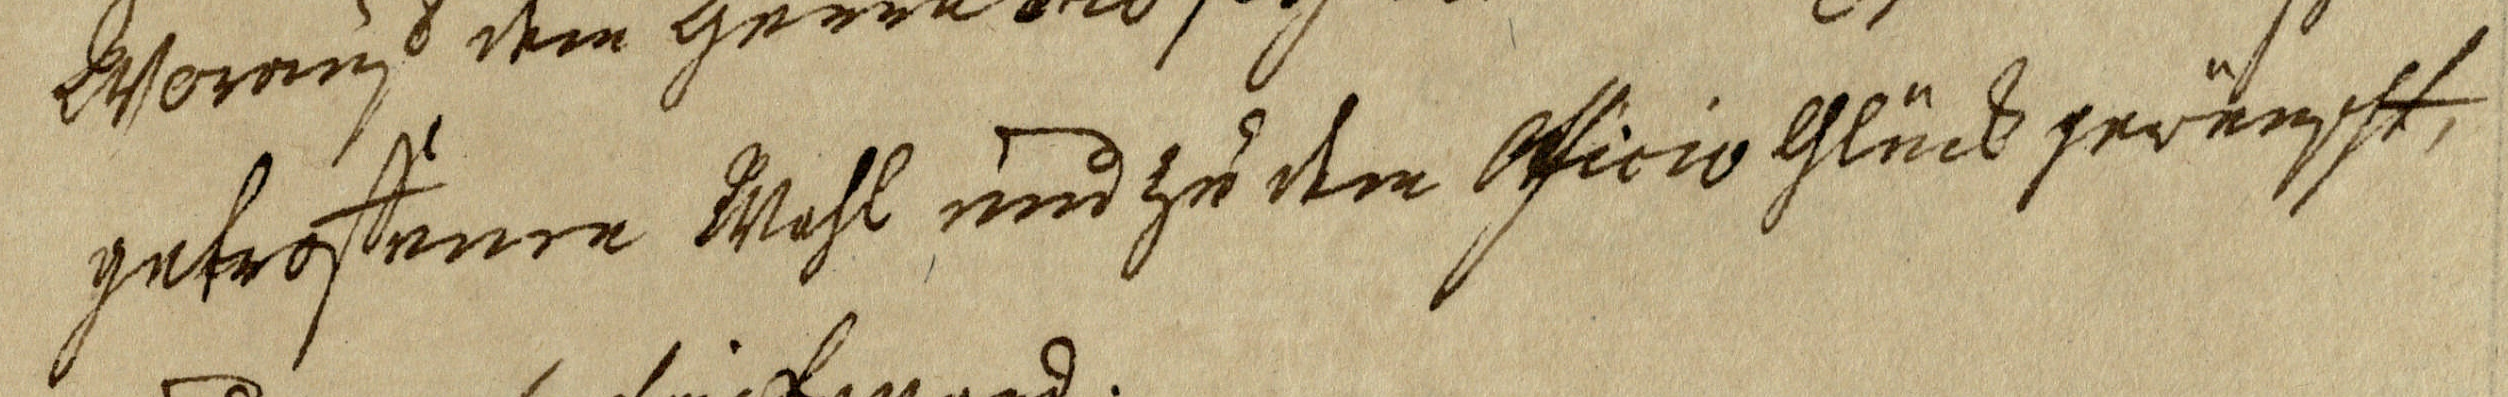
getroffenen Wahl und zu dem officio Glück gewünscht.
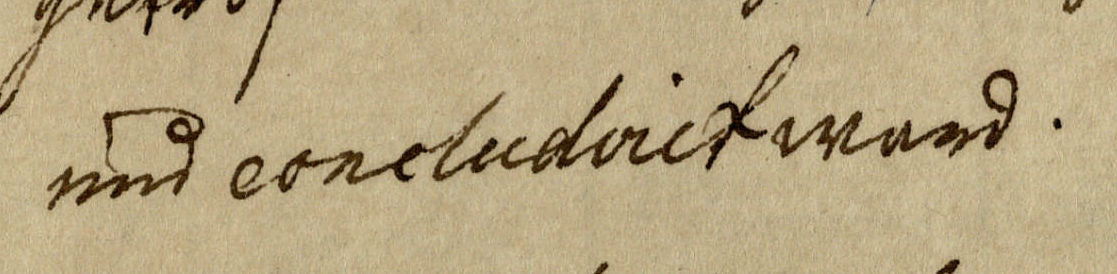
und concludiret ward.
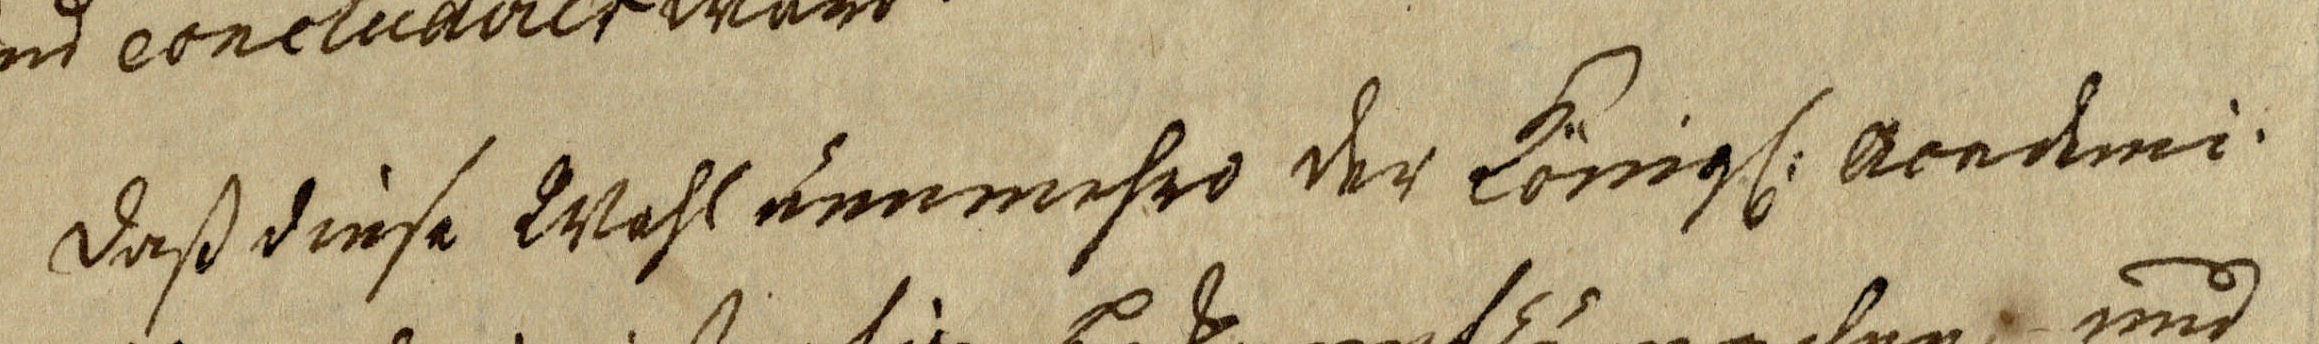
Daß diese Wahl nunmehro der Königl. Academi¬
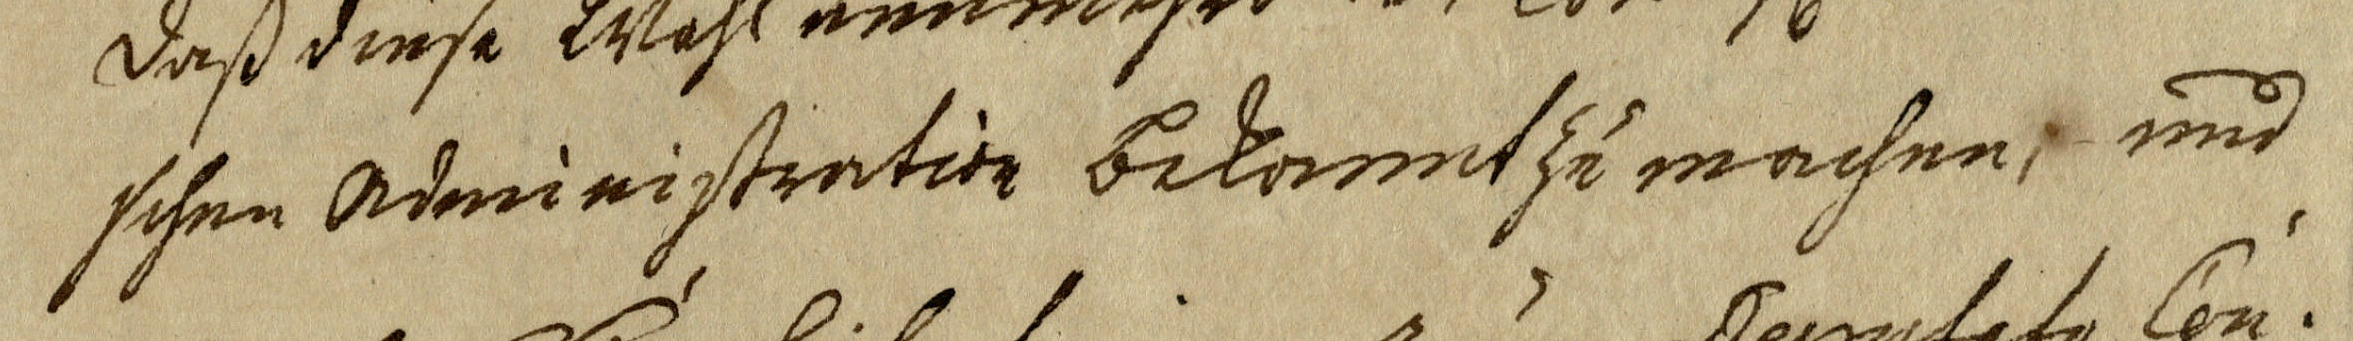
schen Administration bekannt zu machen, und
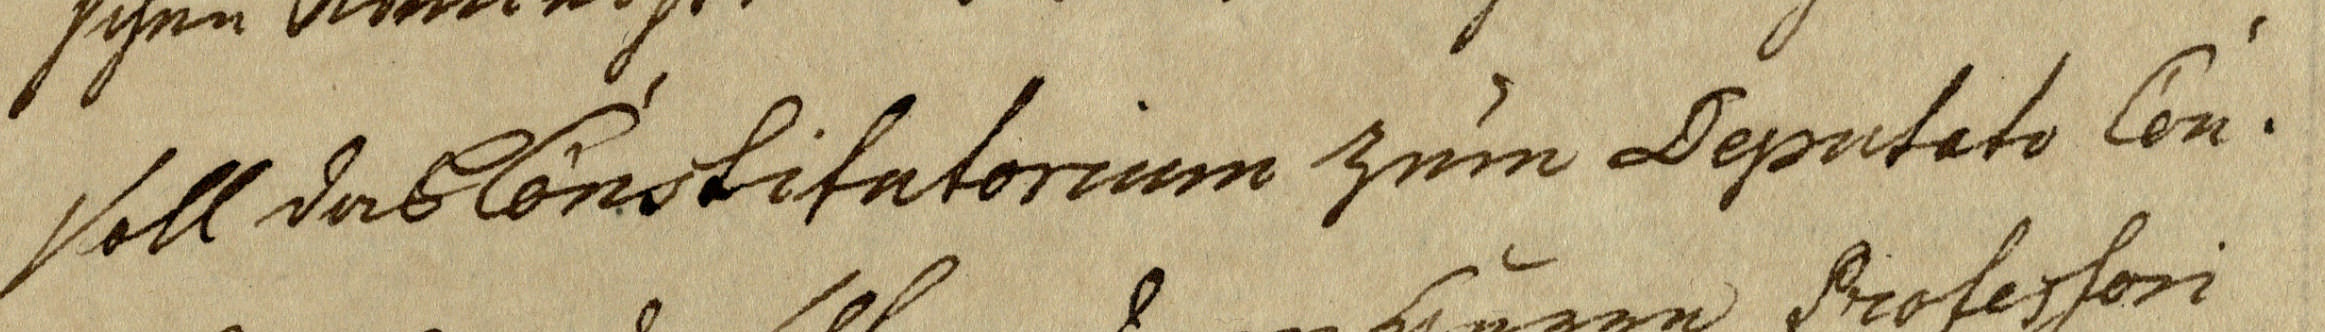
soll das Constitutorium zum Deputato Con¬
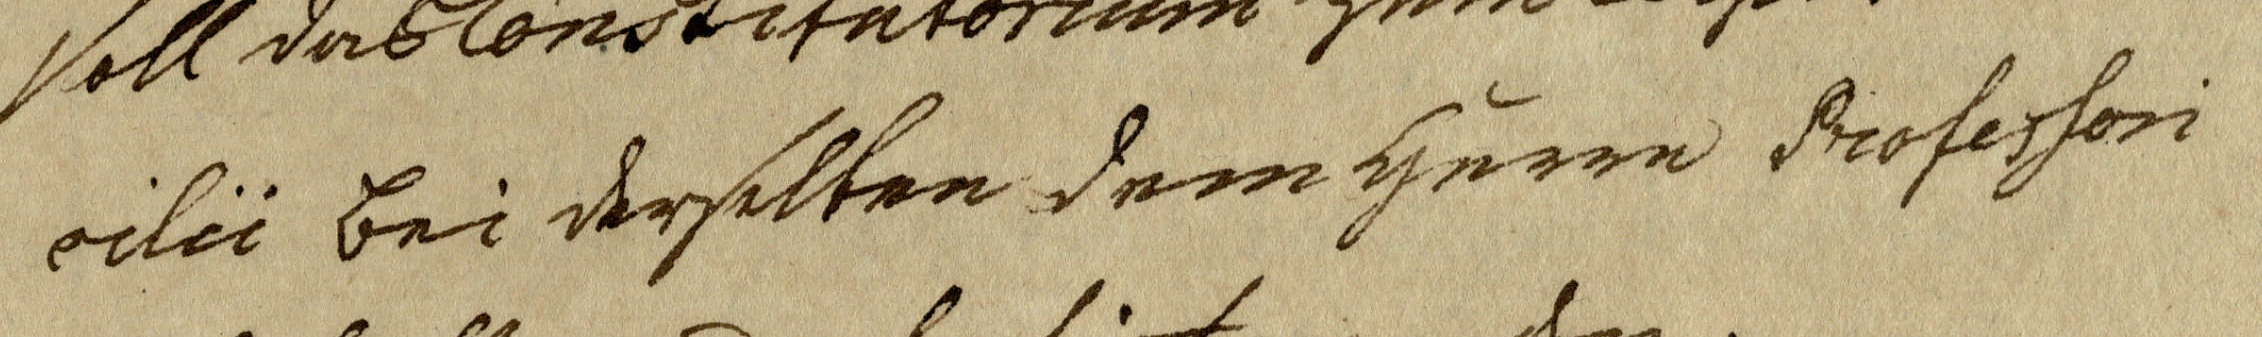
cilii bei derselben dem Herrn Professori
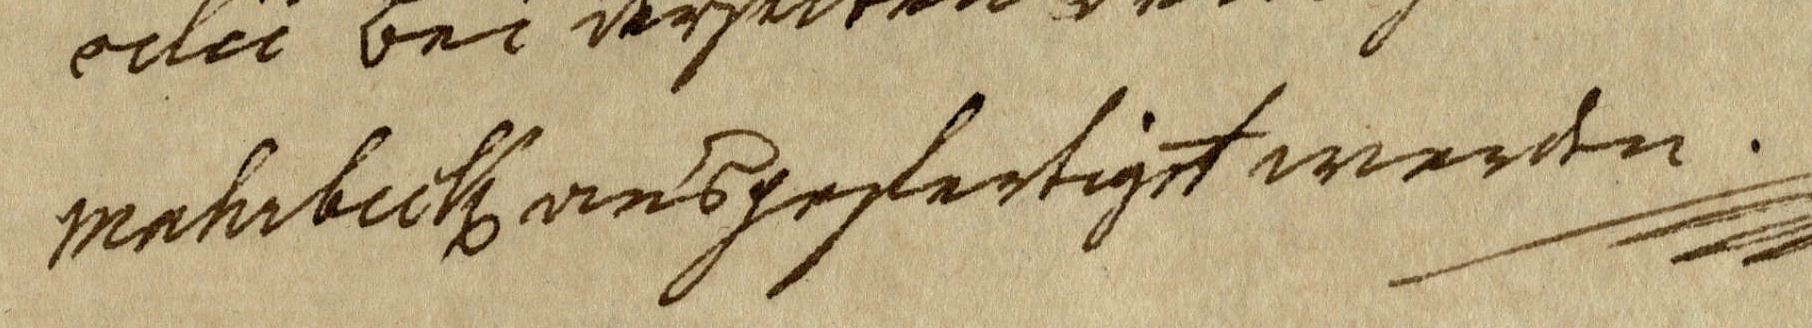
Muhrbeck ausgefertiget werden.
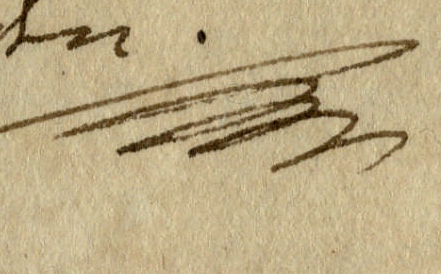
???
